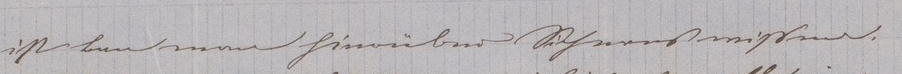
ist kan man hierüber Sicheres wissen.
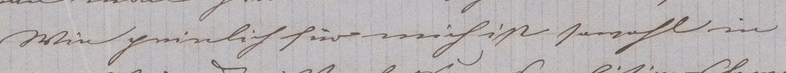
Wie peinlich für mich ist sowohl in
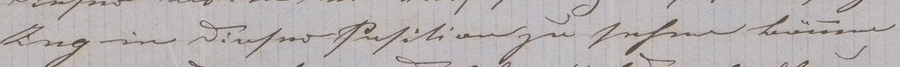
Zug in dieser Position zu sehen können
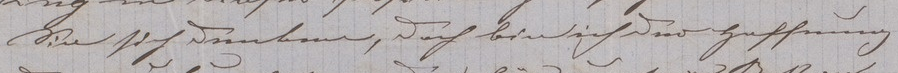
Sie sich denken, doch bin ich der Hoffnung
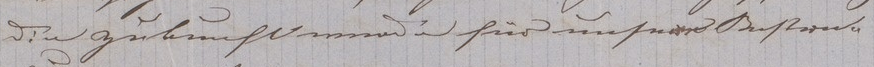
die Zukunft werde für unsere Bestre-
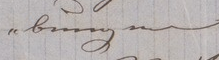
bungen sein.
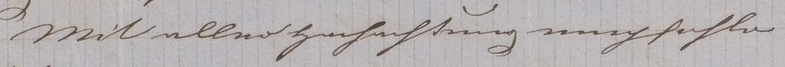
Mit aller Hochachtung empfehle
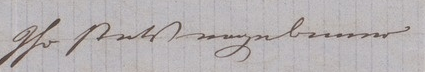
Ihr stets ergebener
